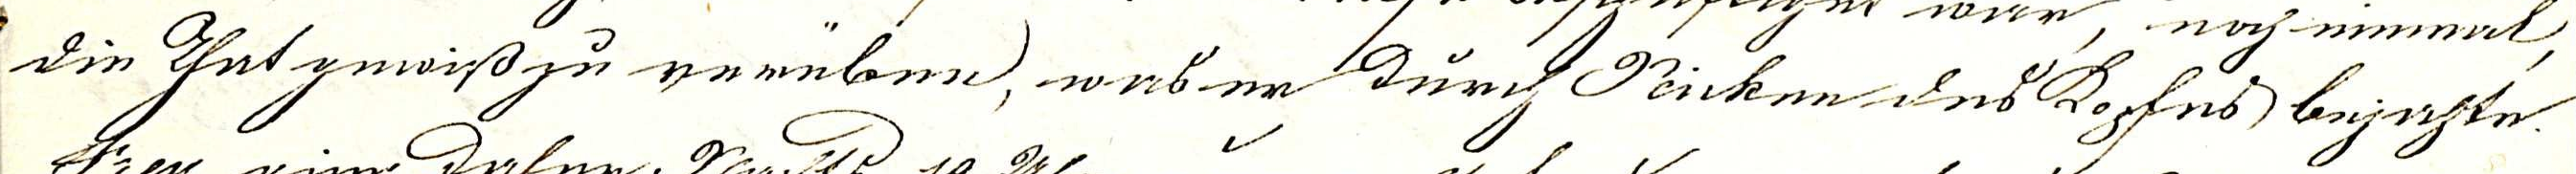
die That gewiß zu verüben, was er durch Nicken des Kopfes bejahte.
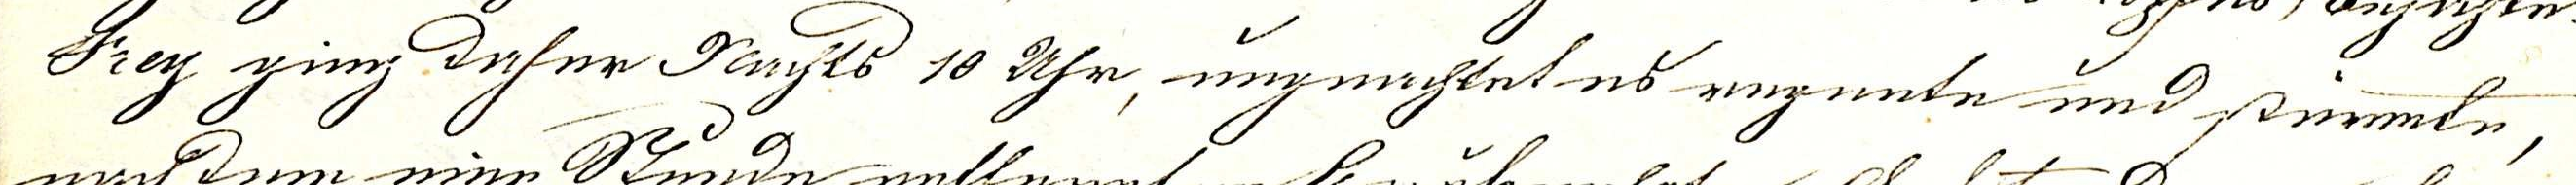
Frey ging daher Nachts 10 Uhr, ungeachtet es regnete und stürmte,
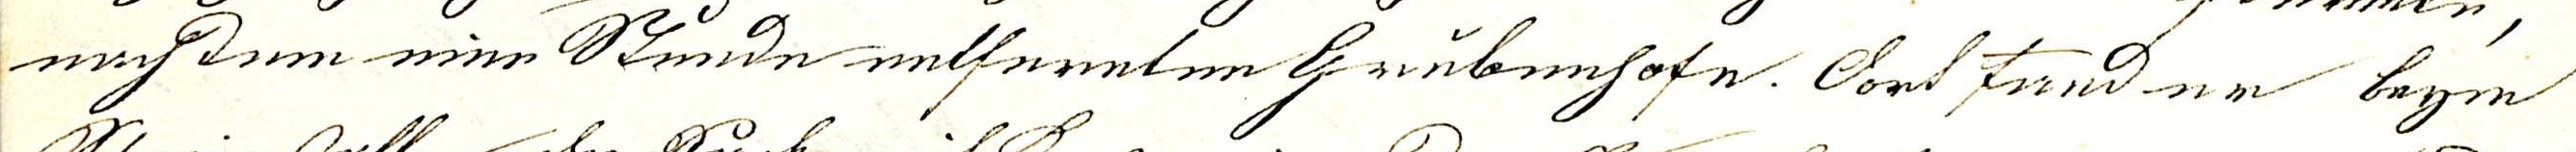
nach dem eine Stunde entfernter Grubenhofe. Dort fand er beym
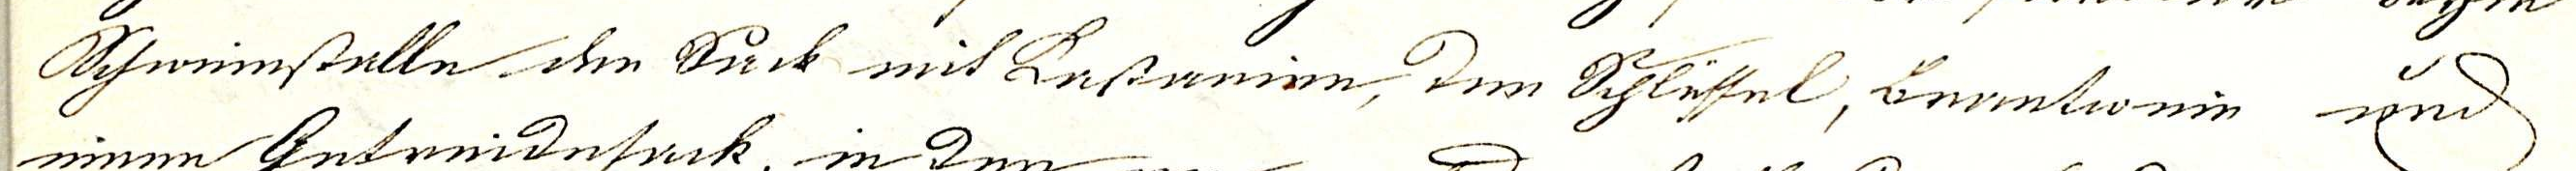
Schweinstalle die Sack mit Kastanien, den Schlüssel, Brantwein und
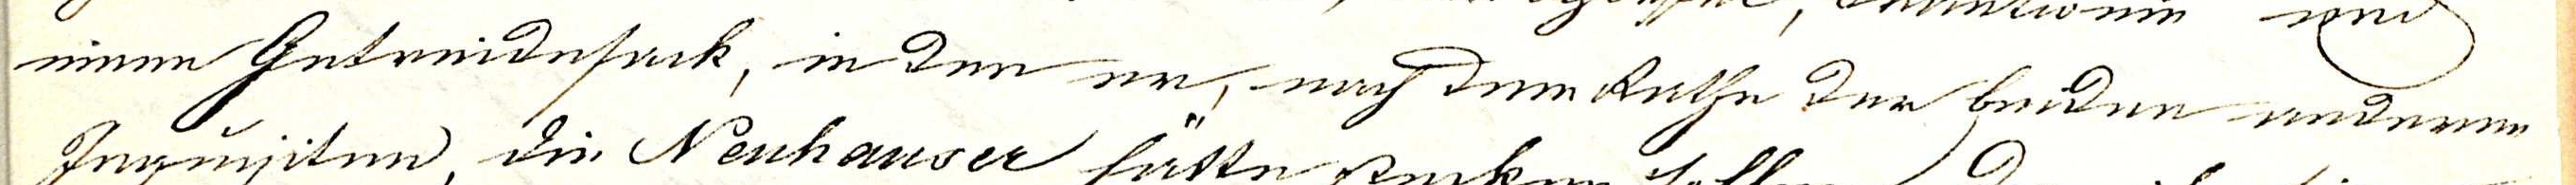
eine Getreidesack, in den er, nach dem Rathe der beiden anderen
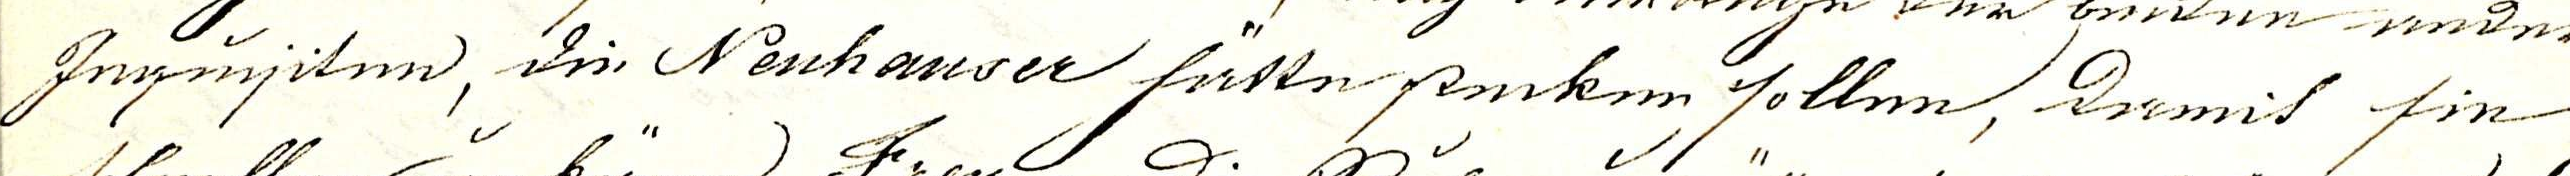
Inquisiten, die Neuhauser hätte stecken sollen, damit sie
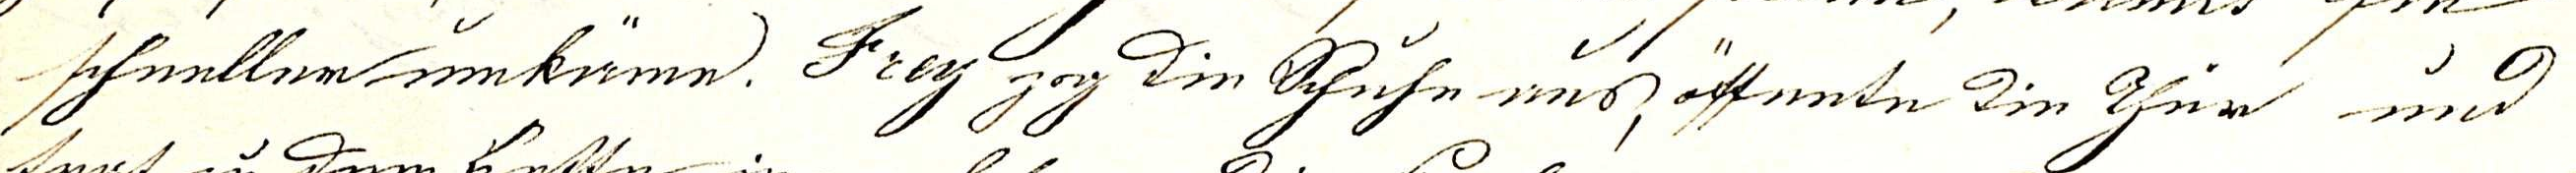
schneller umkäme. Frey zog die Schuhe aus, öffnete die Thür und
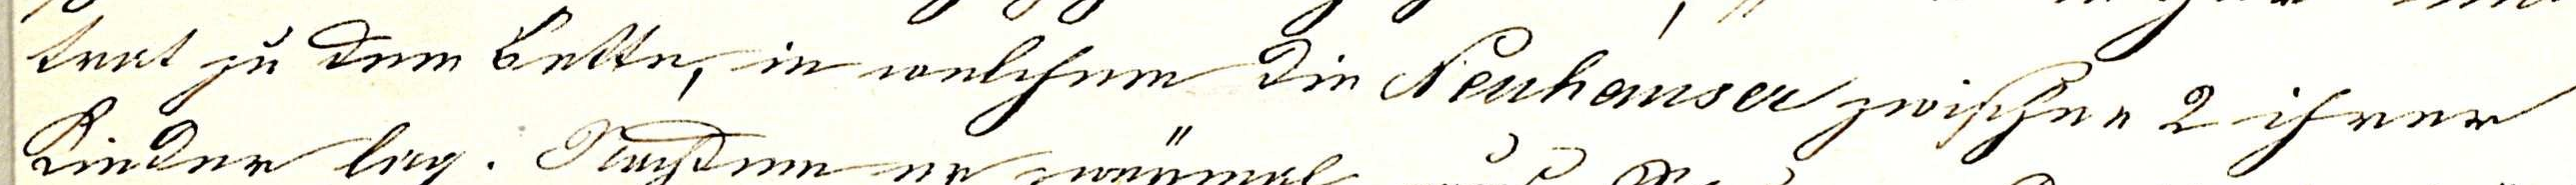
trat zu dem Bette, in welchem die Neuhauser zwischen 2 ihrer
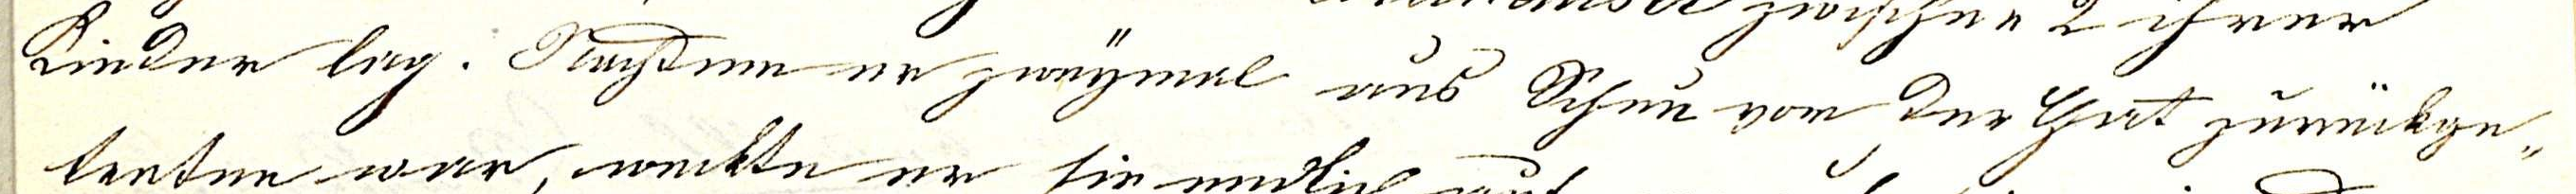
Kinder lag. Nachdem er zweymal aus Scheu vor der That zurückge¬
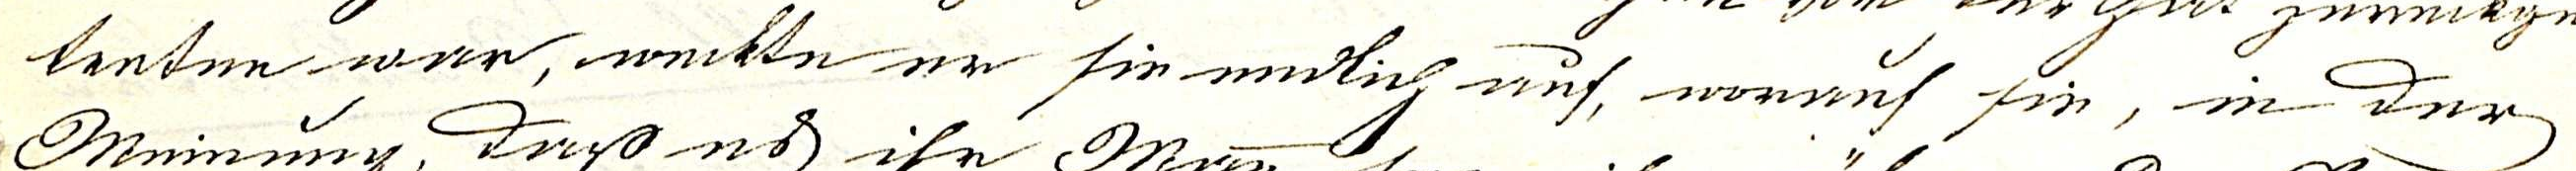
treten war, weckte er sie endlich auf, worauf sie, in der
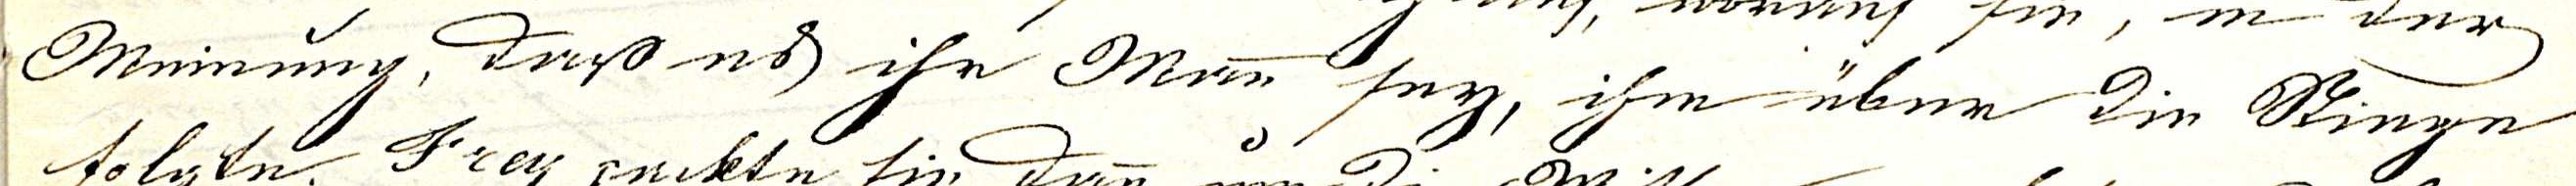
Meinung, daß es ihr Mann sey, ihm über die Stiege
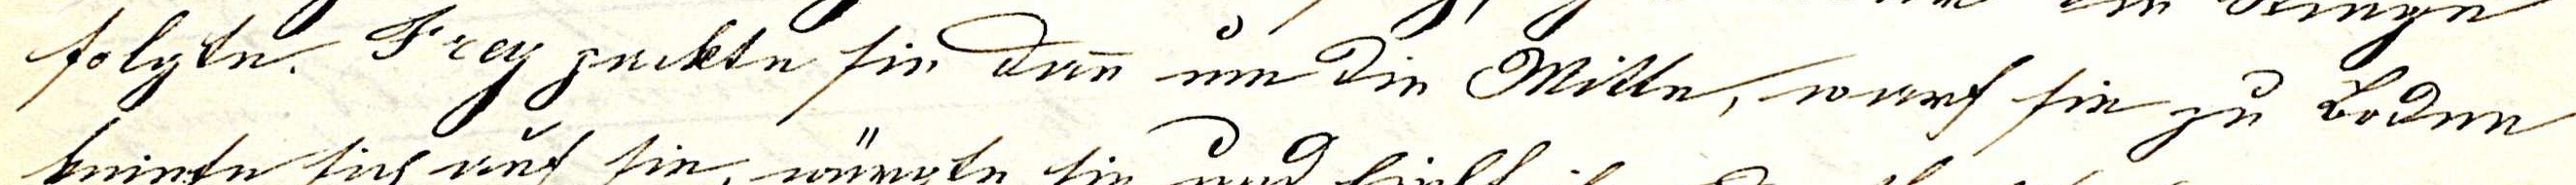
folgte. Frey packte sie dann um die Mitte, warf sie zu Boden
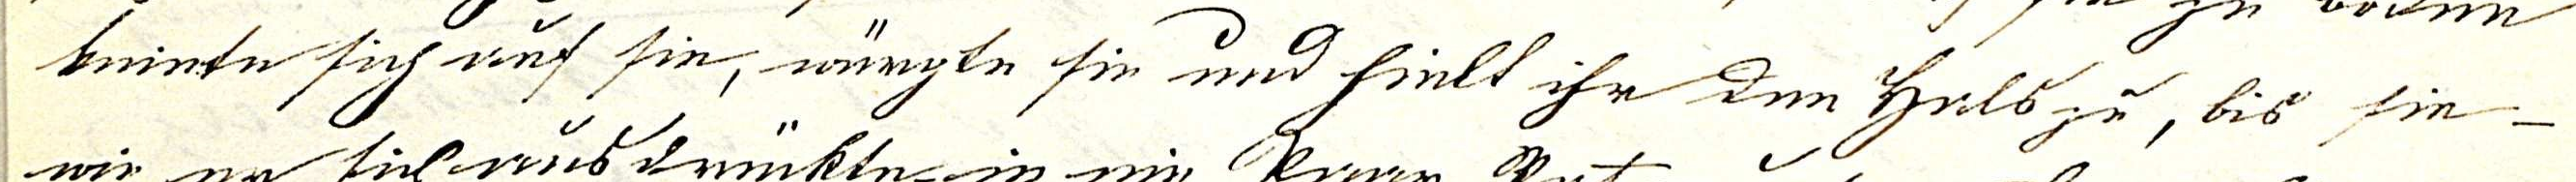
kniete sich auf sie, würgte sie und hielt ihr den Hals zu, bis sie –
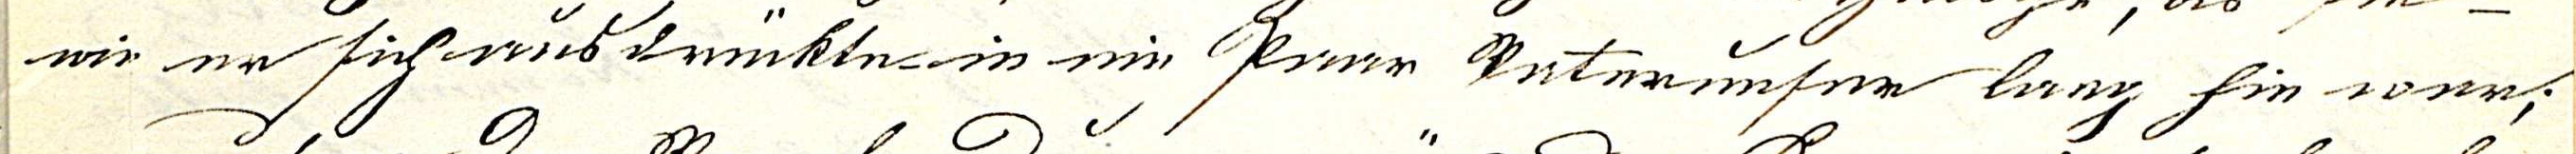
wie er sich ausdrückte – in ein Paar Vaterunser lang hin war;
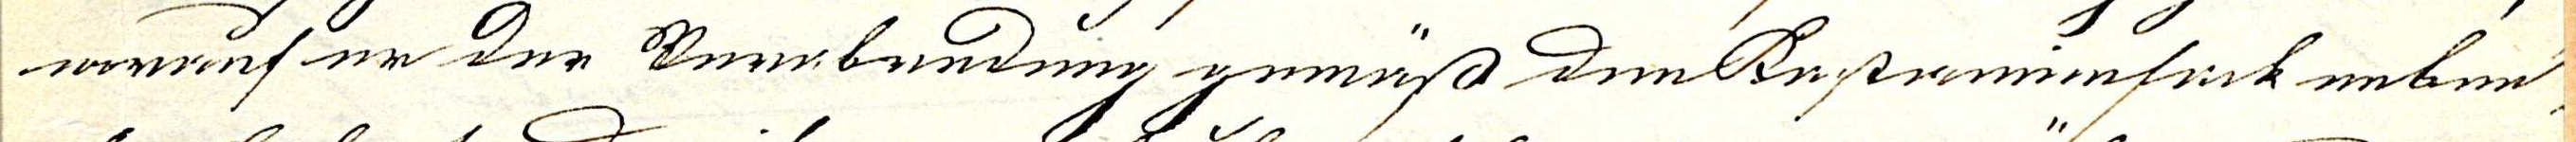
worauf er der Verabredung gemäß dem Kastaniensack neben
